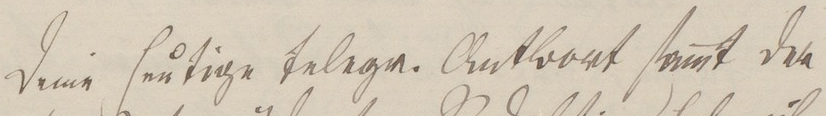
Deine heutige telegr. Antwort sammt der
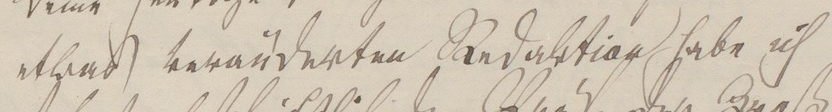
etwas veränderten Redaktion habe ich
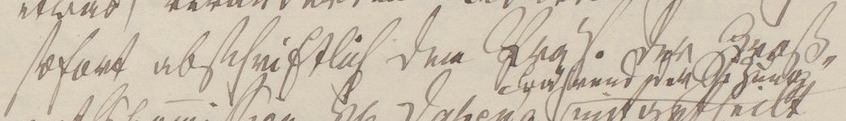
sofort abschriftlich dem Präs. der Groß-
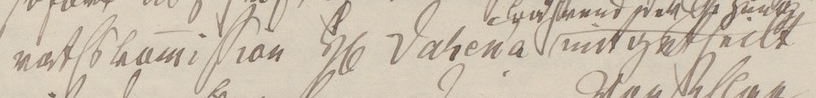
rathskommission Herr Varennawährend der Sizung mitgetheilt
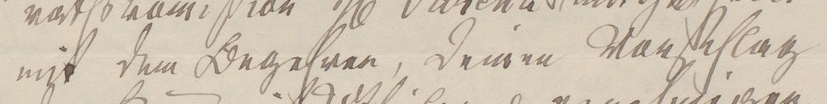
mit dem Begehren, Deinen Vorschlag
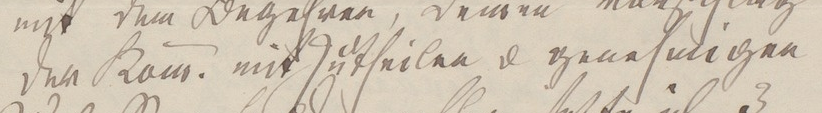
der Komm. mitzutheilen & genehmigen
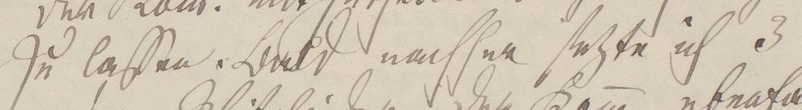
zu lassen. Bald nachher sezte ich 3
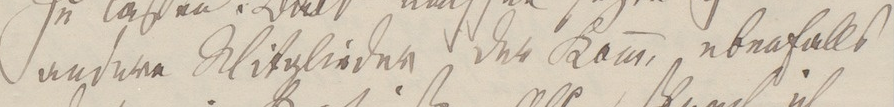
andere Mitglieder der Komm. ebenfalls
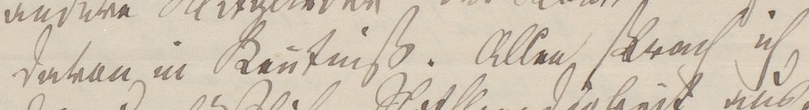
davon in Kenntniß. Allen sprach ich
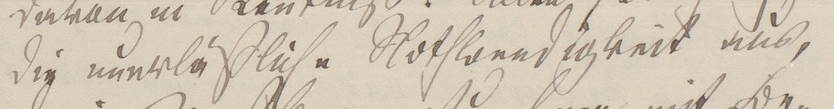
die unerläßliche Nothwendigkeit aus,
